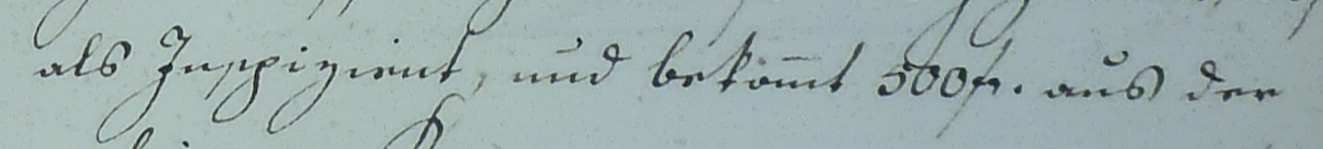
als Inspizient, und bekom̅t 500fr. aus der
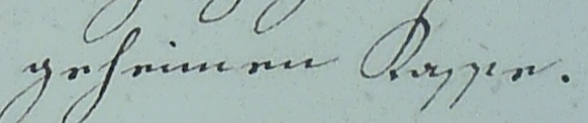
geheimen Kasse.
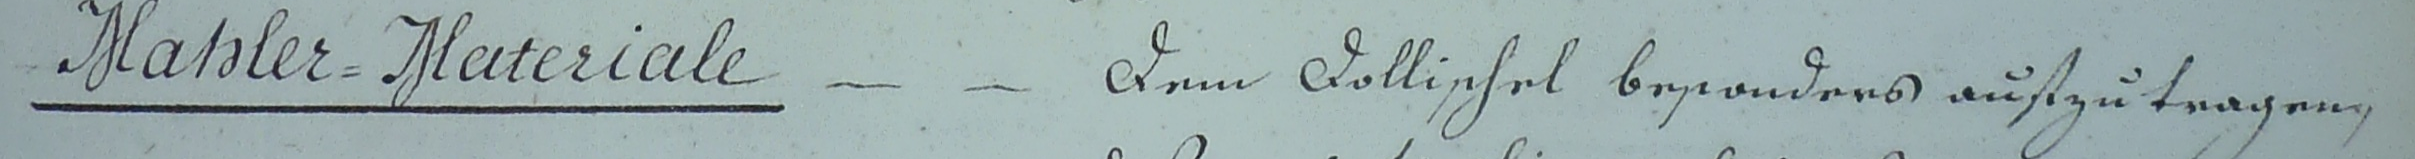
Mahler‗Materiale _ _ Dem Dollischel besonders aufzutragen,
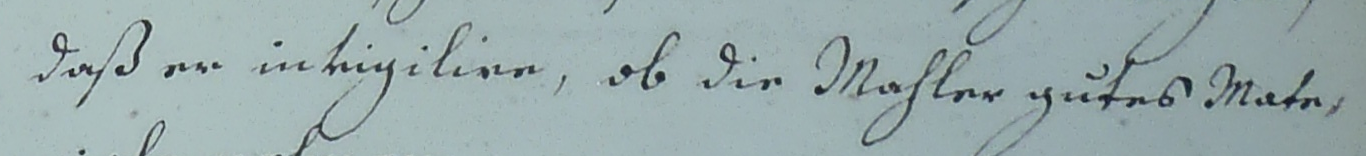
daß er invigilire, ob die Mahler gutes Mate¬
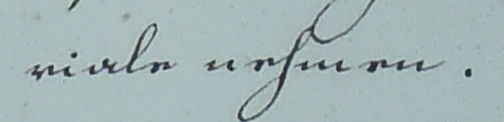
riale nehmen.
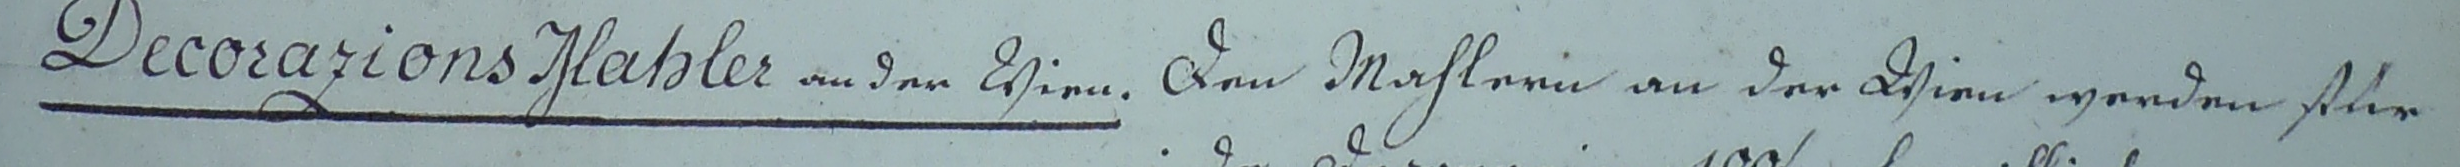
Decorazions Mahler an der Wien. Den Mahlern an der Wien werden für
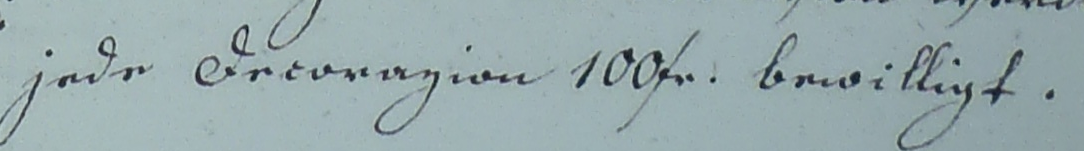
jede Decorazion 100fr. bewilligt.
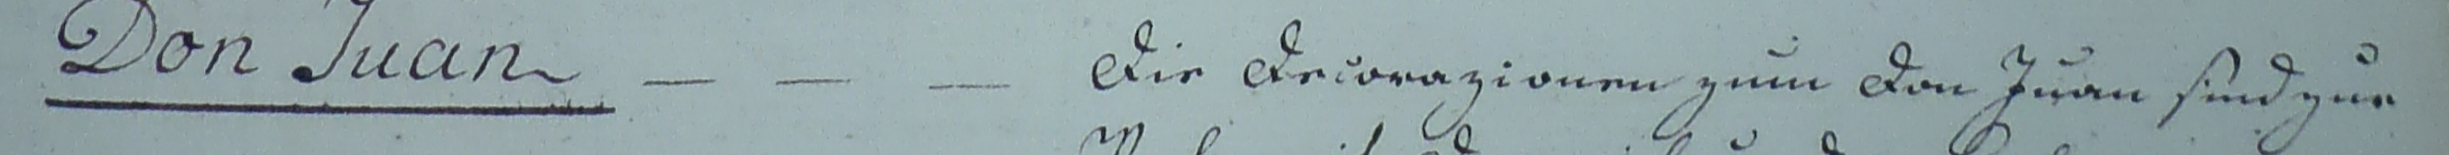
Don Juan _ _ _ Die Decorazionen zum Don Juan sind zur
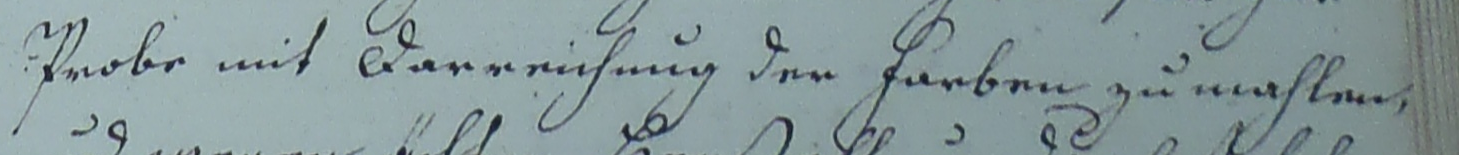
Probe mit Darreichung der Farben zu mahlen,
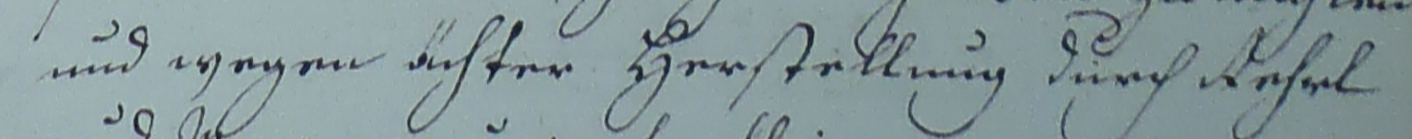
und wegen ächter Herstellung durch Rehrl
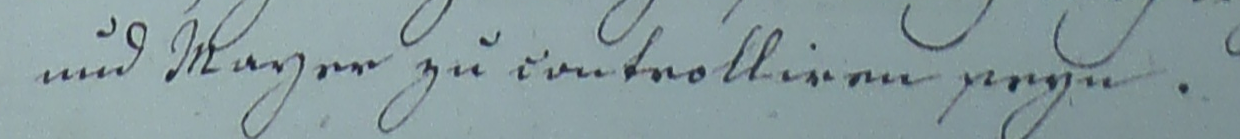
und Mayer zu controlliren seyn.
